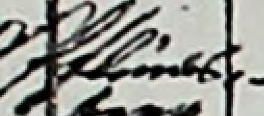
Pflinds„
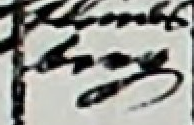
berg
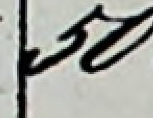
50
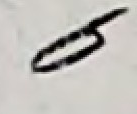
6
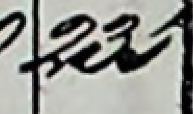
235
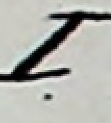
I
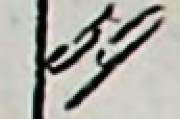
59
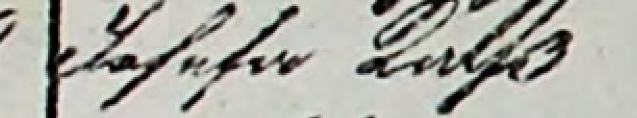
Josefa Kalß
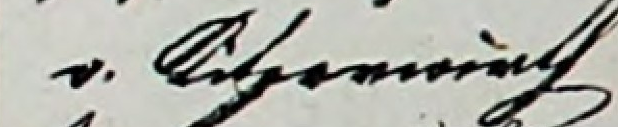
v. Kit?ernirth
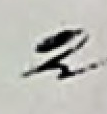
2
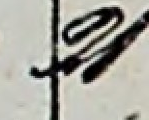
21
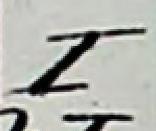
I
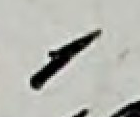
1
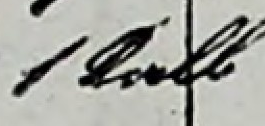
1 Kalb
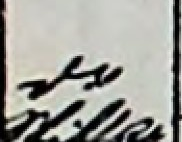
do
